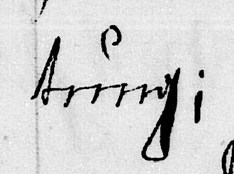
tung;
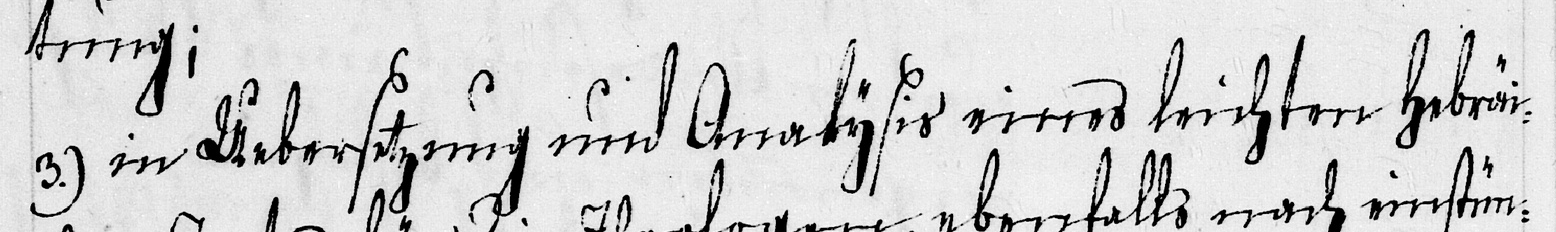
3.) in Uebersetzung und Analysis eines leichten Hebräi¬
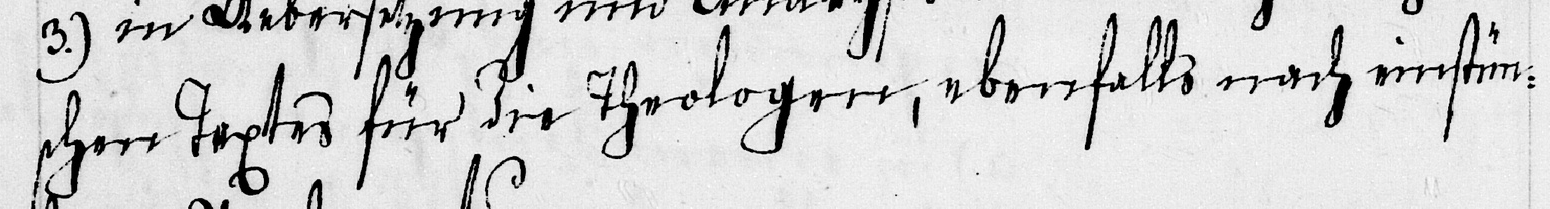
schen Textes für die Theologen, ebenfalls nach einstün¬
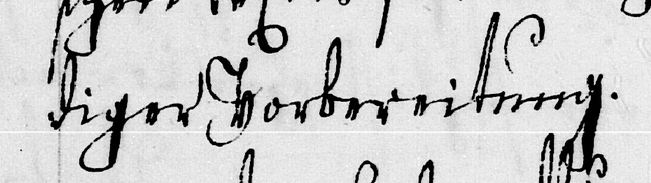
diger Vorbereitung;
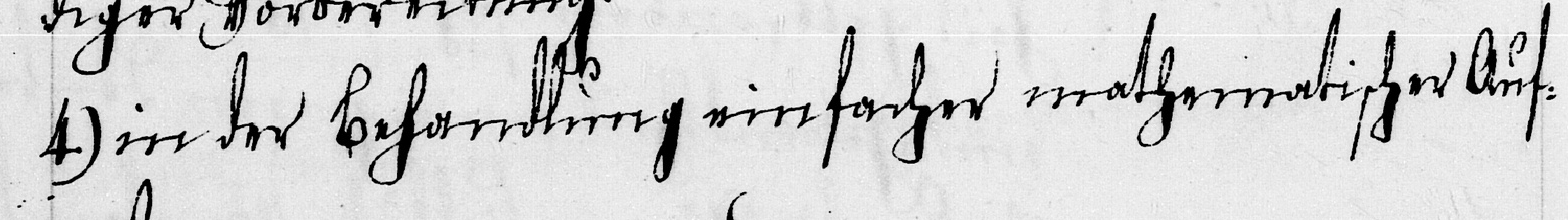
4.) in der Behandlung einfacher mathematischer Auf¬
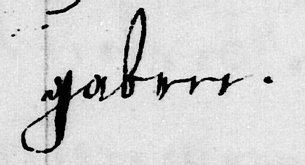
gaben.
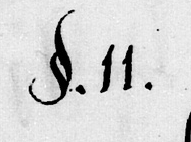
§. 11.
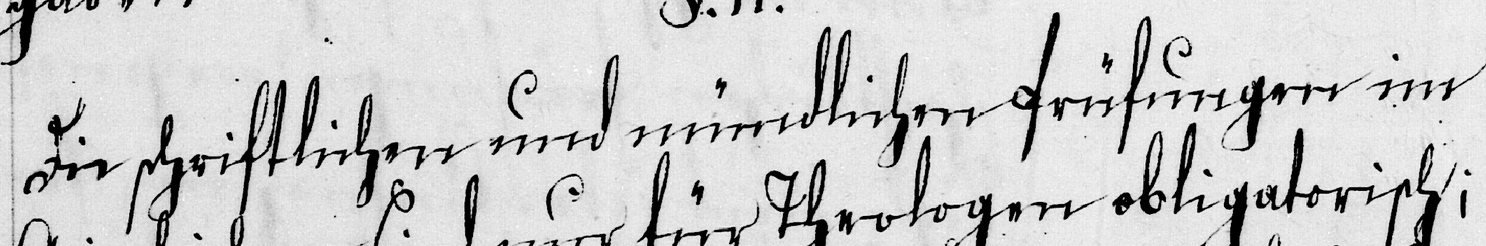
Die schriftlichen und mündlichen Prüfungen im
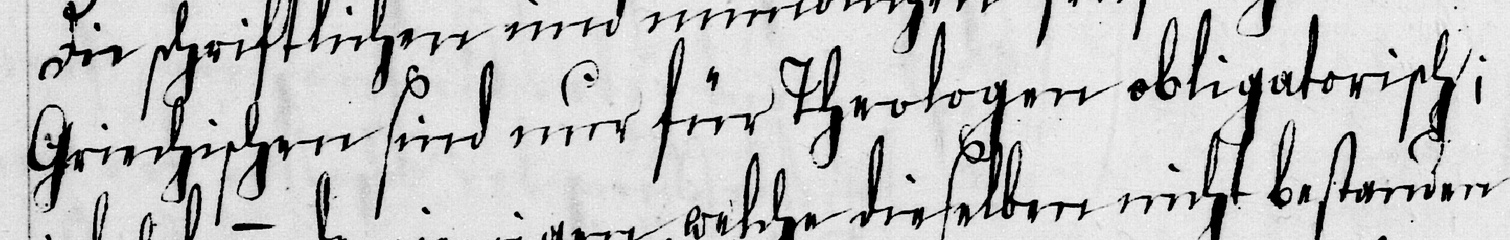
Griechischen sind nur für Theologen obligatorisch;
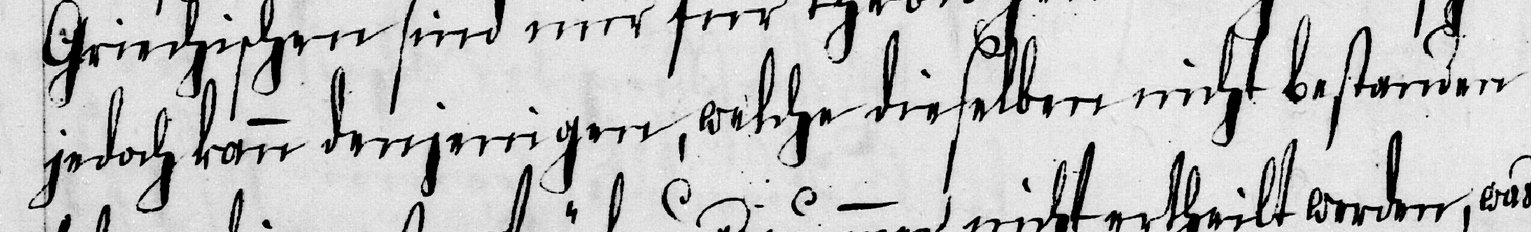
jedoch kann denjenigen, welche dieselben nicht bestanden
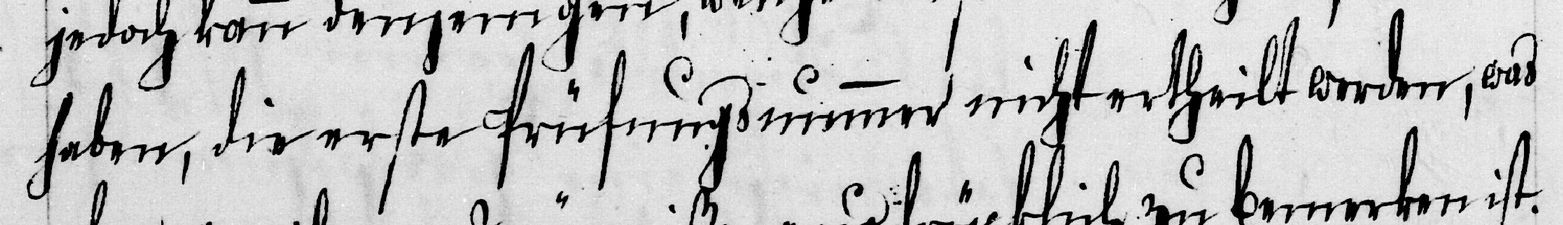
haben, die erste Prüfungsnummer nicht ertheilt werden, was
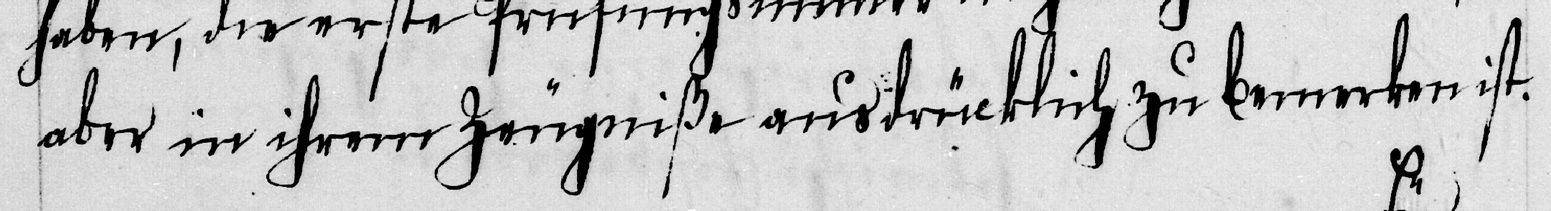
aber in ihren Zeugniße ausdrücklich zu bemerken ist.
